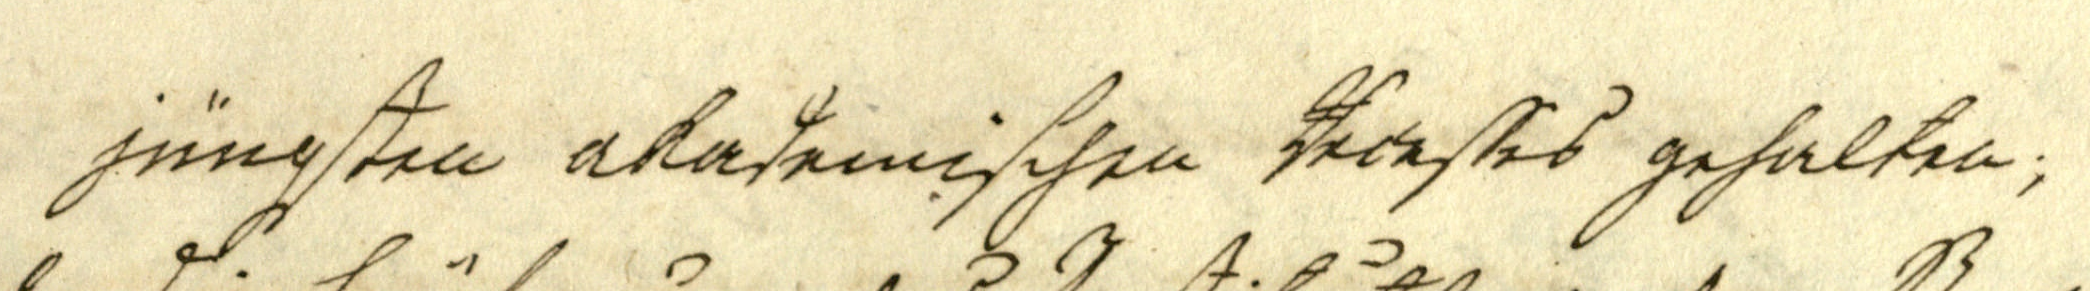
jüngsten akademischen Recesses gehalten;
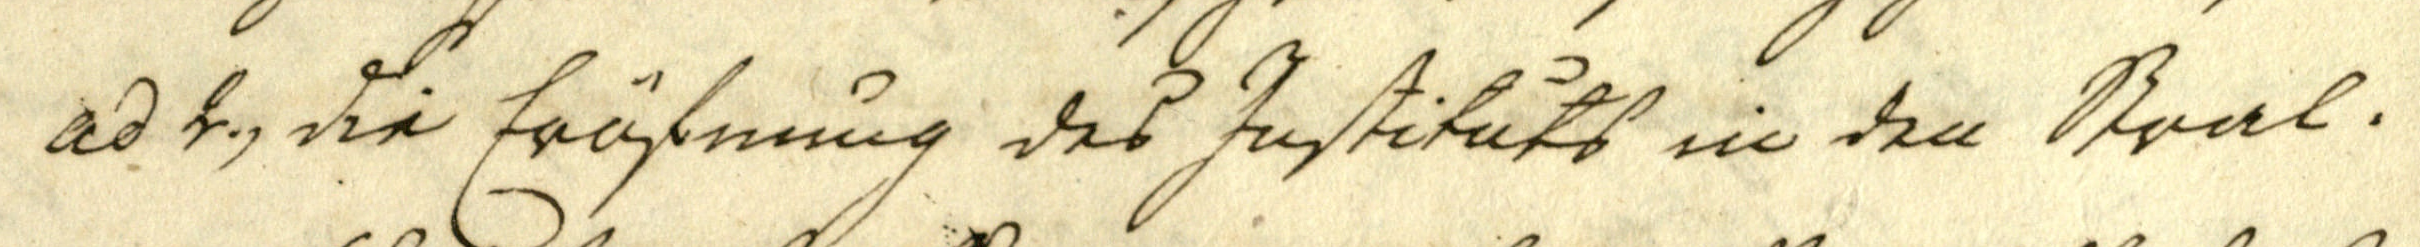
ad 2., die Eröfnung des Instituts in den Stral¬
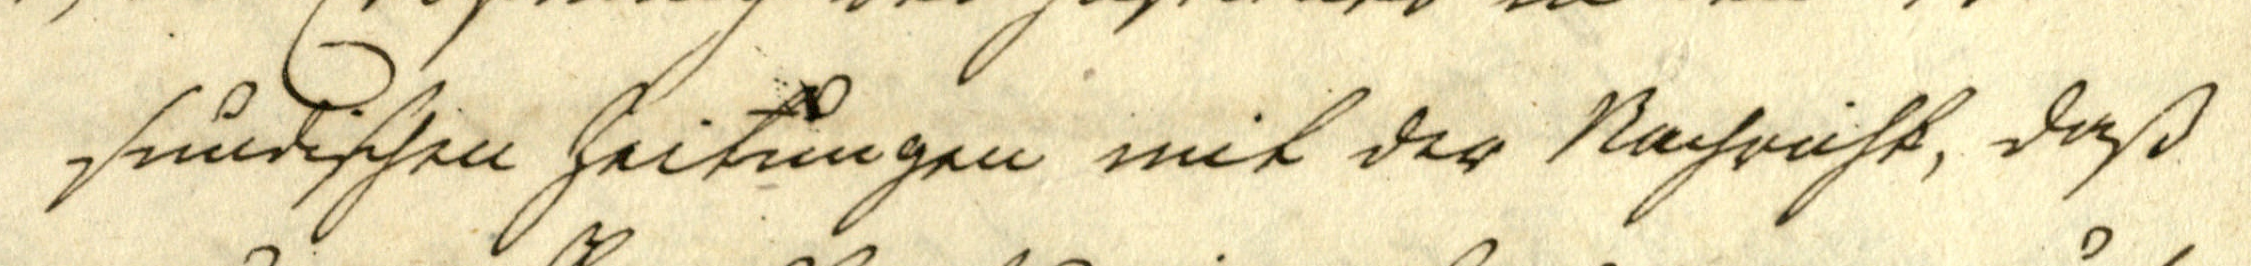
sundischen Zeitungen mit der Nachricht, daß
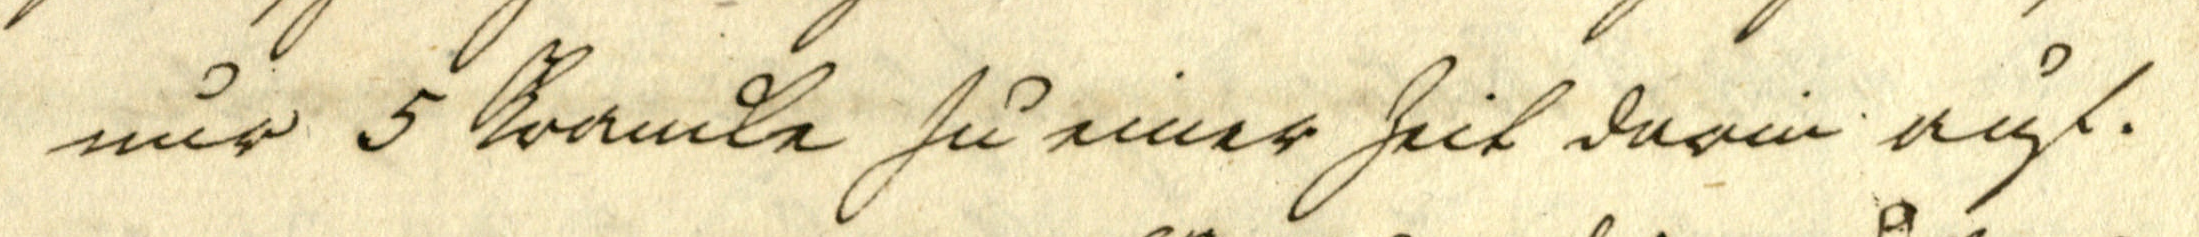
nur 5 Krancke zu einer Zeit darin auf¬
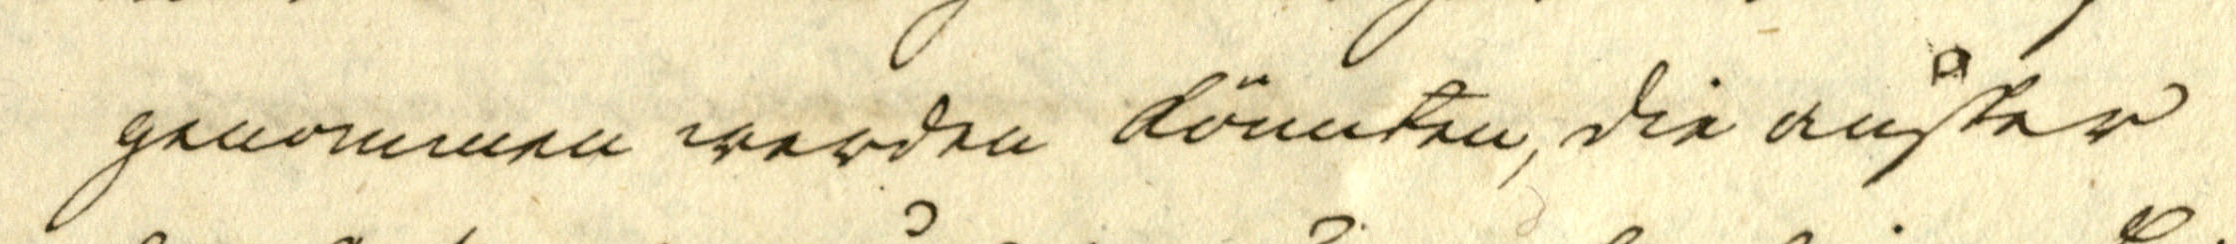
genommen werden könnten, die ausser
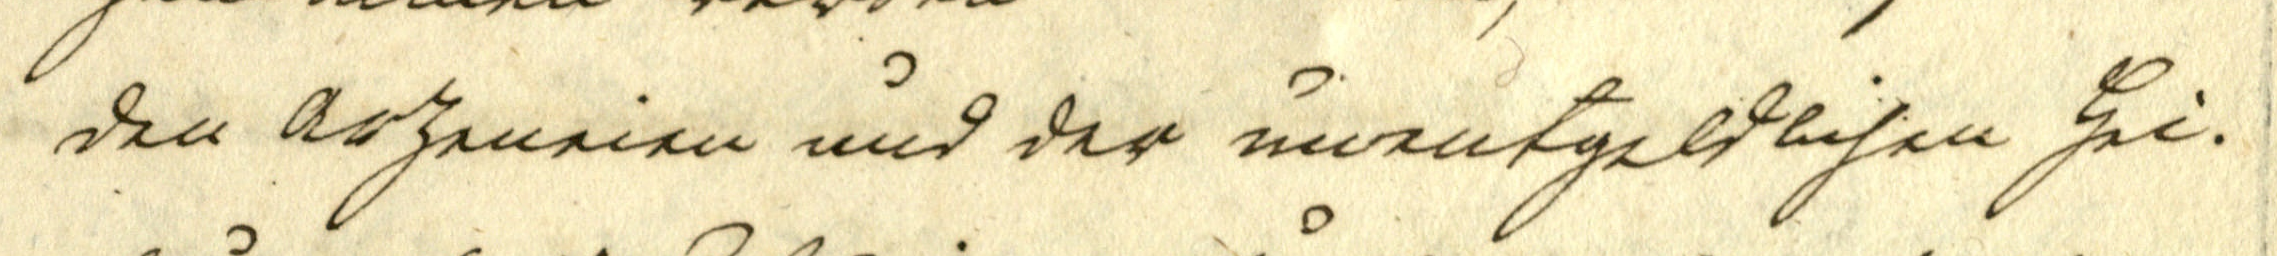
den Arzeneien und der unentgeldlichen Hei¬
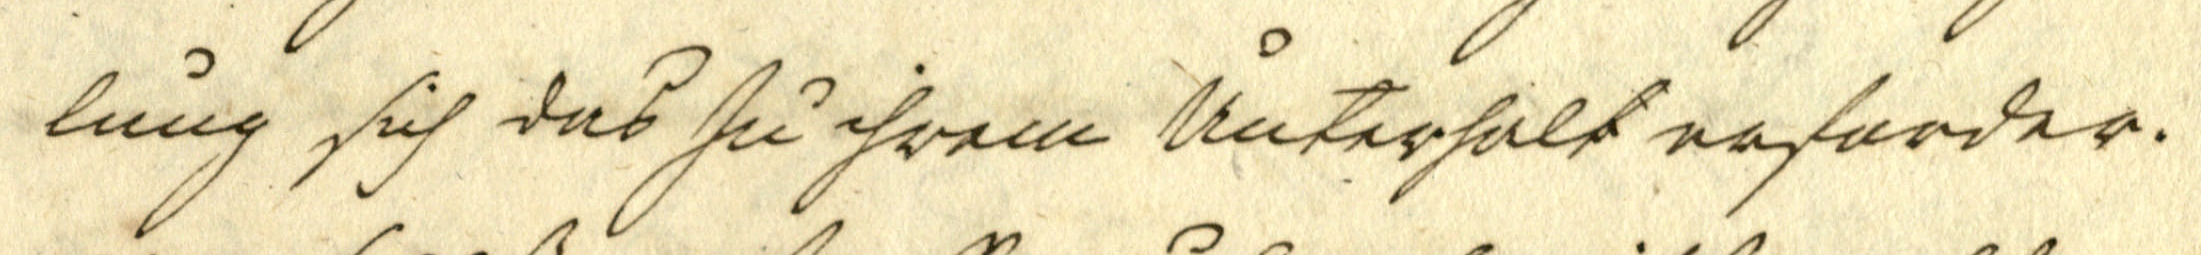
lung sich das zu ihrem Unterhalt erforder¬
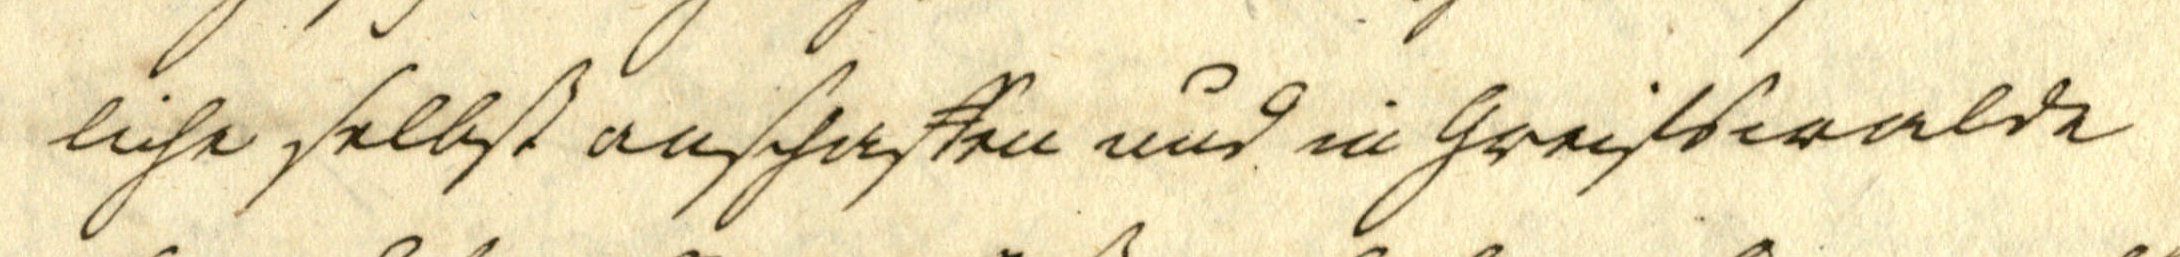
liche selbst anschaffen und in Greifswalde
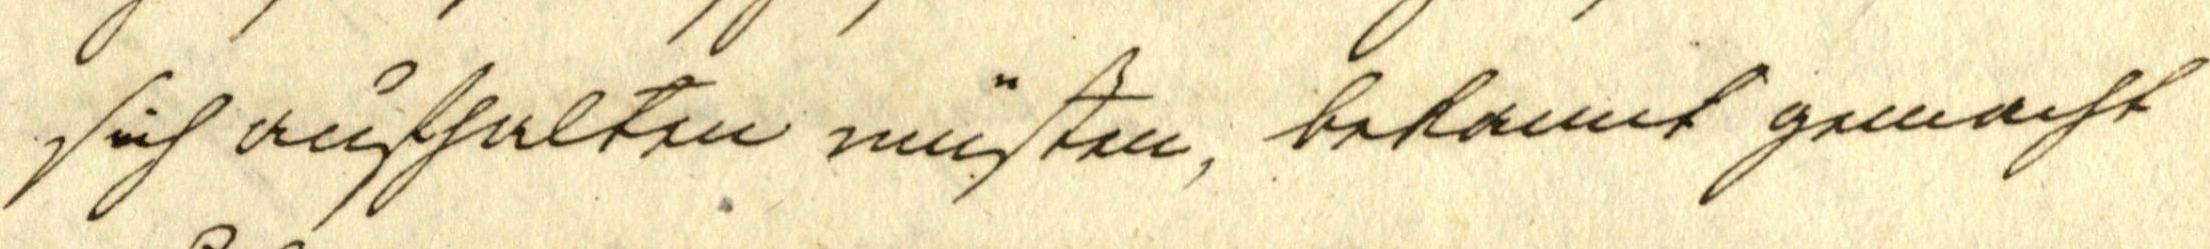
sich aufhalten müßten, bekannt gemacht
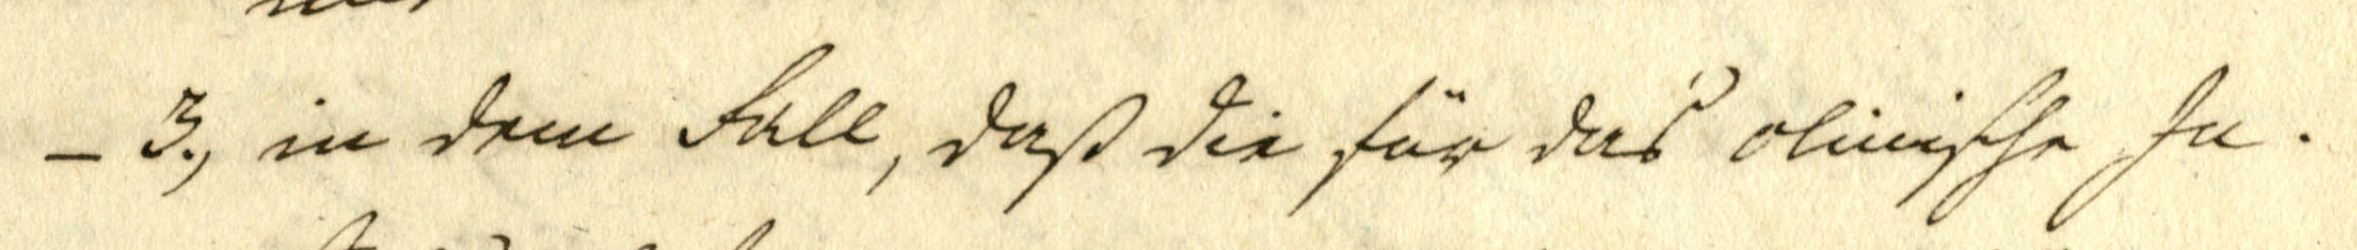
3., in dem Fall, daß die für das clinische In¬
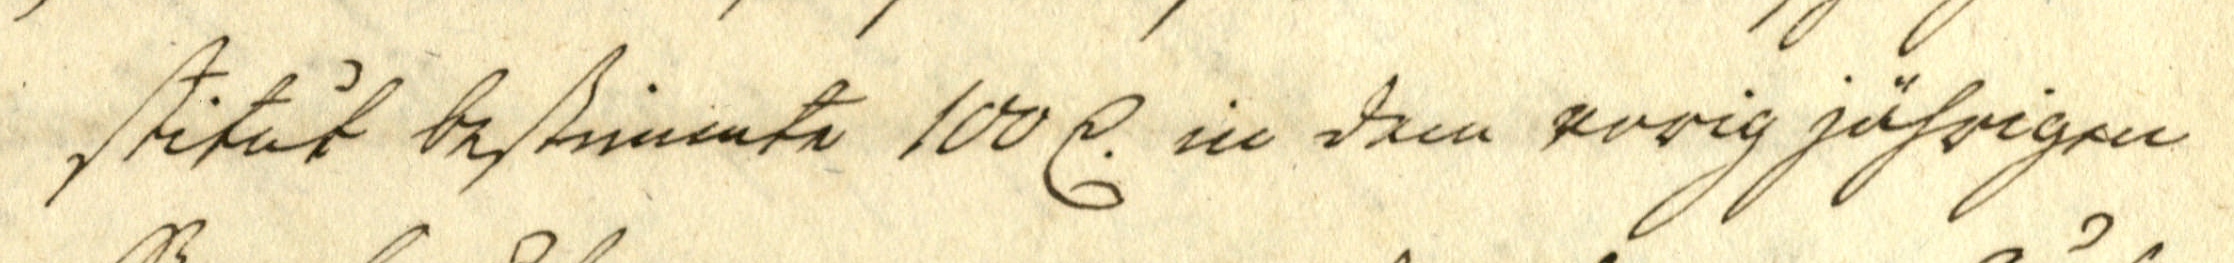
stitut bestimmte 100 l. in dem vorig jährigen
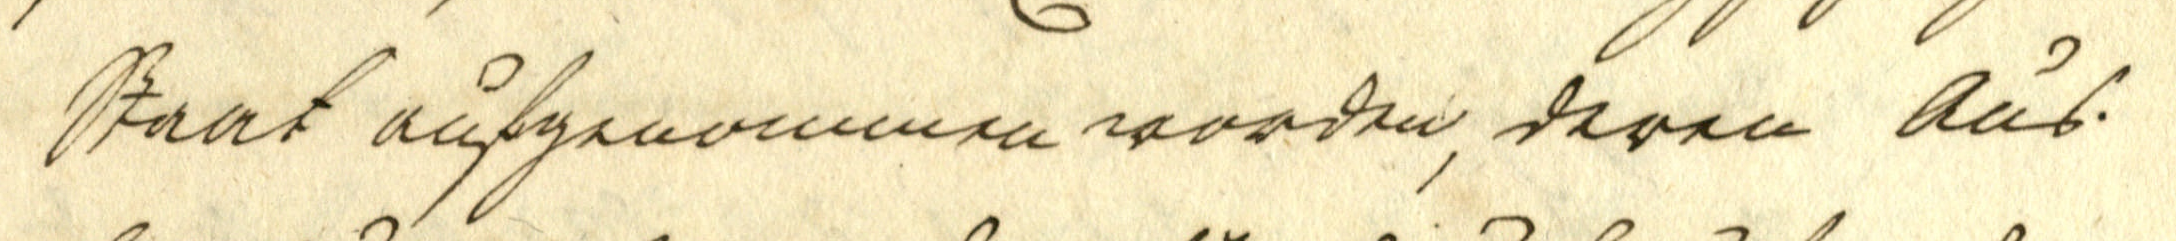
Staat aufgenommen worden, deren Aus¬
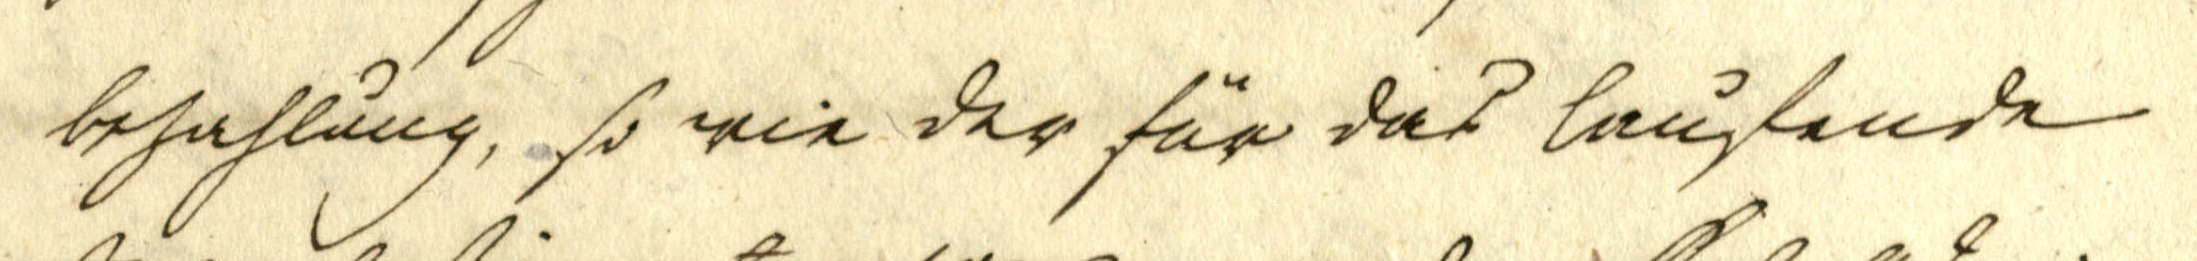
bezahlung, so wie der für das laufende
